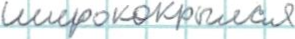ширококрылая
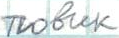тювик
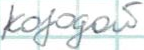козодой
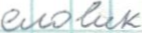еловик
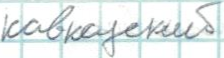кавказский
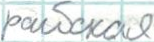райская
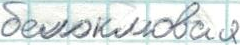белоклювая
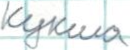кукша
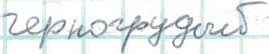черногрудый
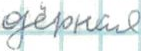озёрная
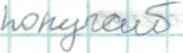попугай
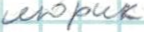люрик
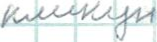кликун
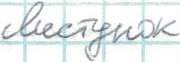свистунок
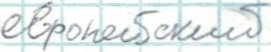европейский
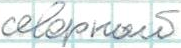северный
